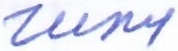чиж
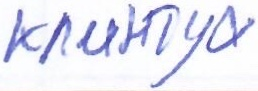клинтух
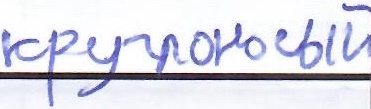круглоносый
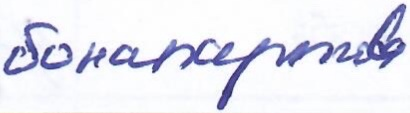бонапартова
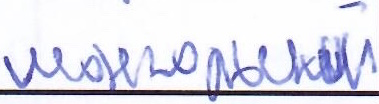монгольский
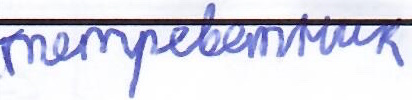тетревятник
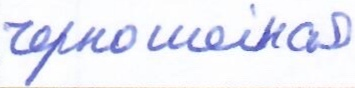черношейная
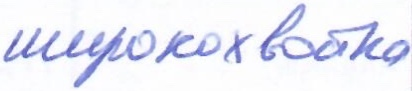широкохвостка
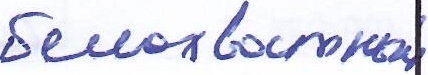белохвостный
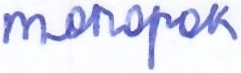топорок
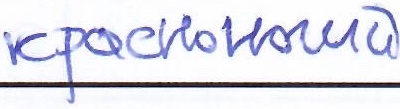красноногий
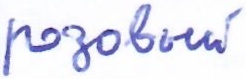розовый
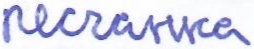песчанка
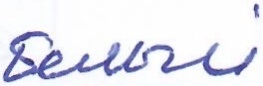белый
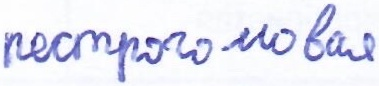пестрогомовая
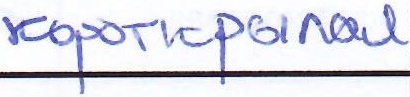короткрылая
